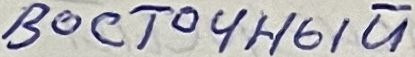восточный
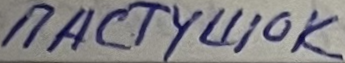пастушок
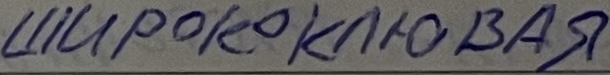ширококлювая
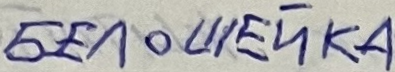белошейка
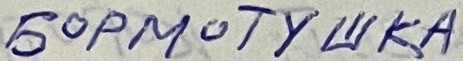бормотушка
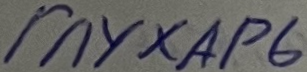глухарь
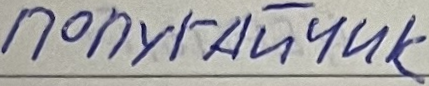попугайчик
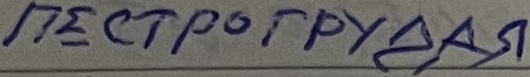пестрогрудая
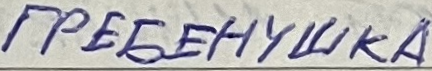гребенушка
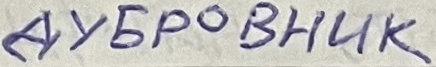дубровник
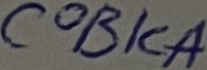совка
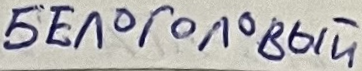белоголовый
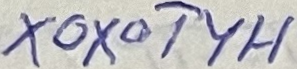хохотун
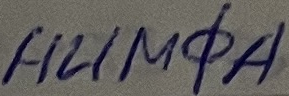нимфа
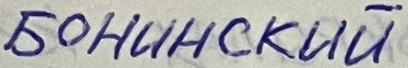бонинский
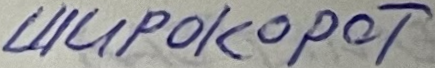широкорот
